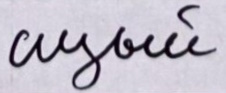сизый
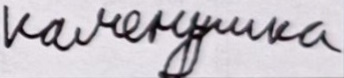каменушка
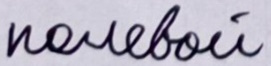полевой
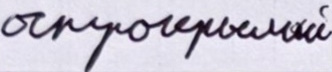острокрылый
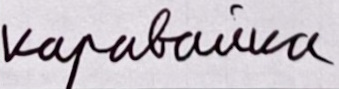каравайка
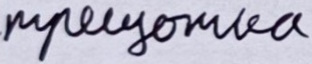трещотка
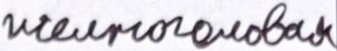желтоголовая
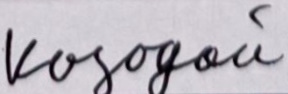козодой
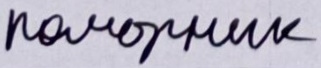поморник
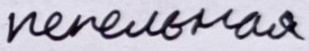пепельная
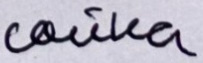сойка
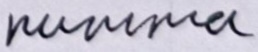питта
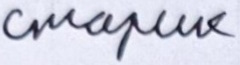старик
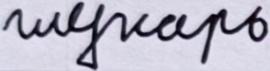глухарь
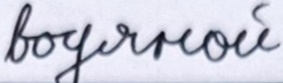водяной
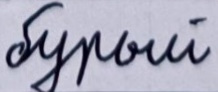бурый
